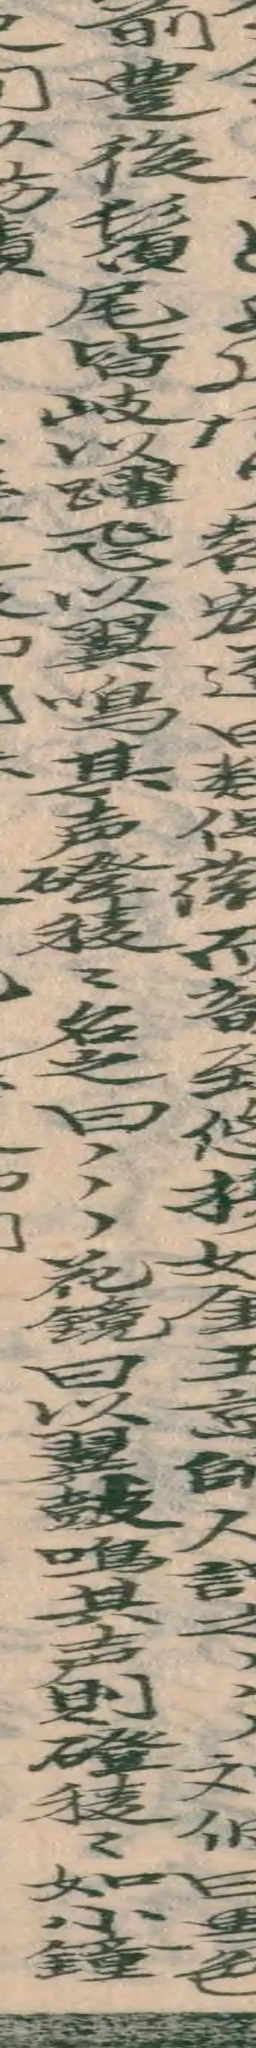鋭前豊後鬚尾皆岐以躍飛以翼鳴其声磴稜々名之曰花鏡曰以翼鼓鳴其声則磴稜々如小鐘
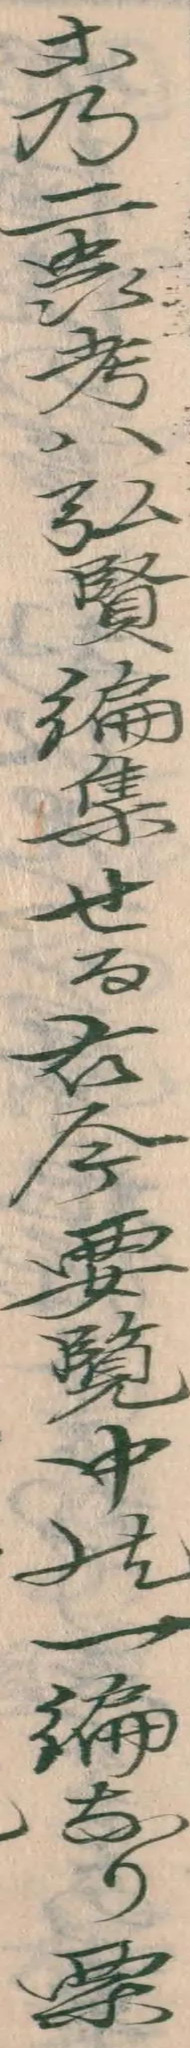この二蟲考は弘賢編集せる古今要覧中の一編なり栗
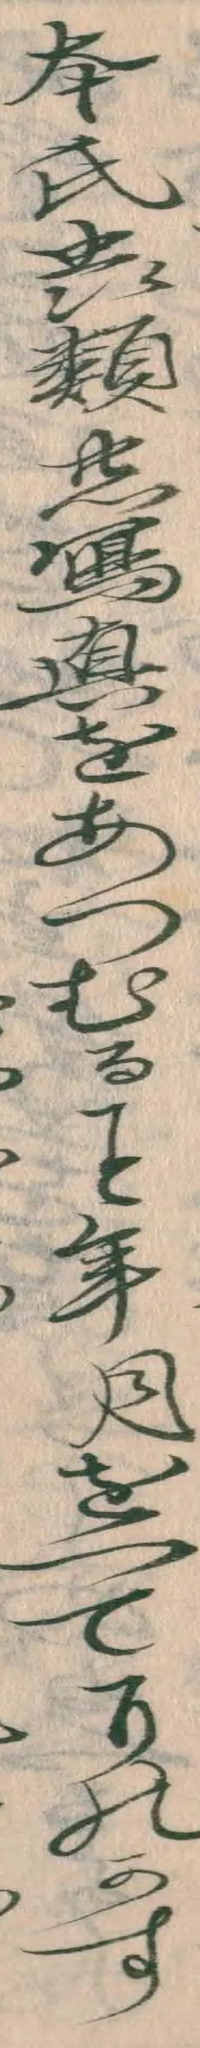本氏蟲類の写真をあつむること年月をへてそのかす
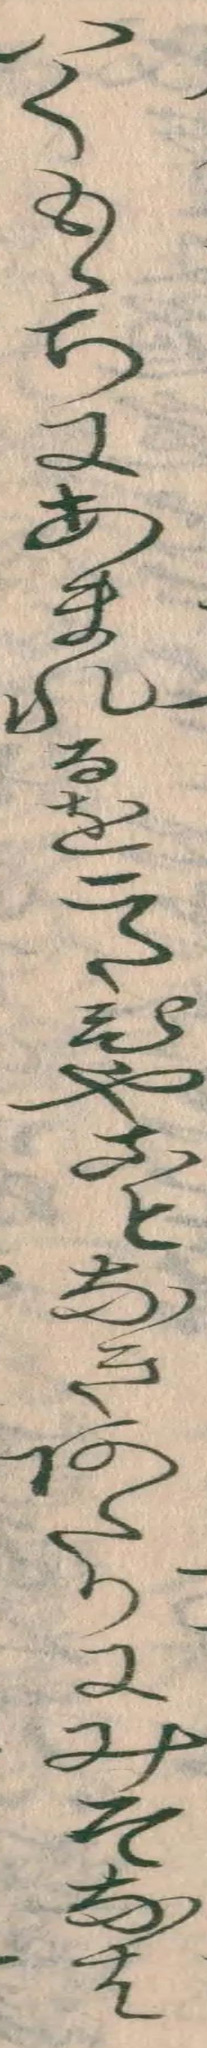いくもゝちにあまれるをこたひやことなきあたりにみそなは
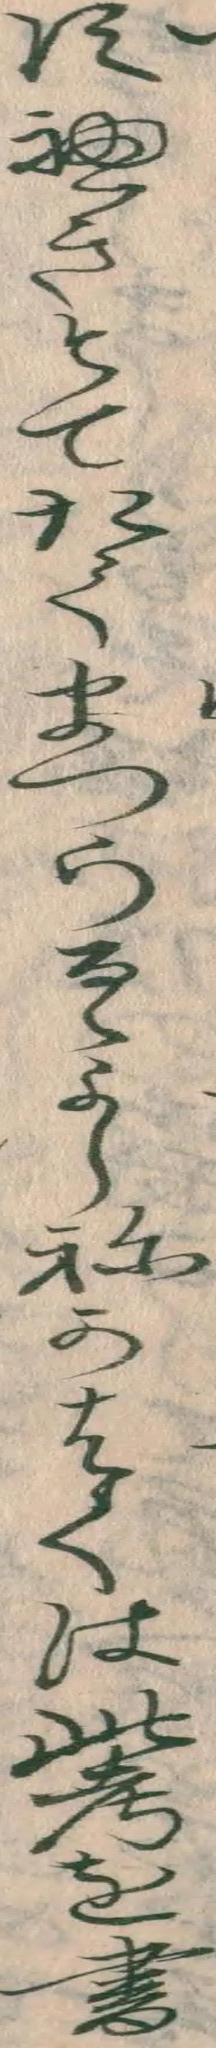すへきとてたてまつらるゝよしねかはくは此考を書
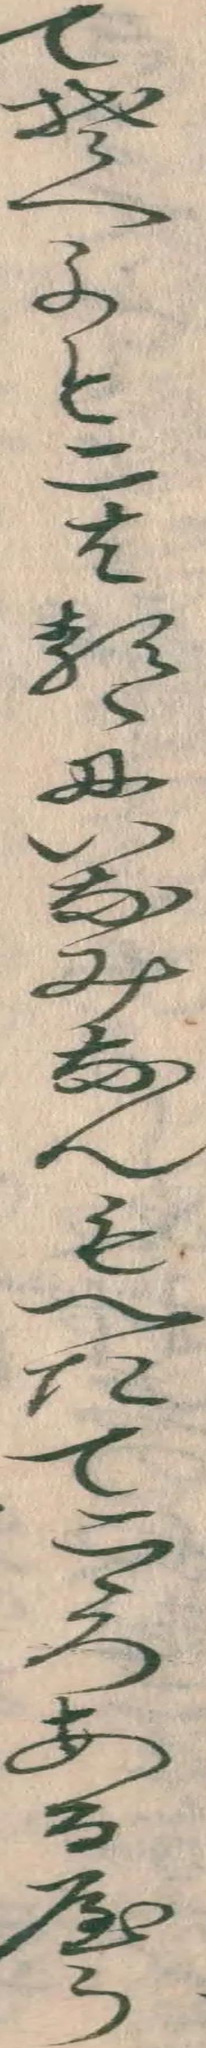てそへよとこはるゝにいなみなんもへたてこゝろあるやう
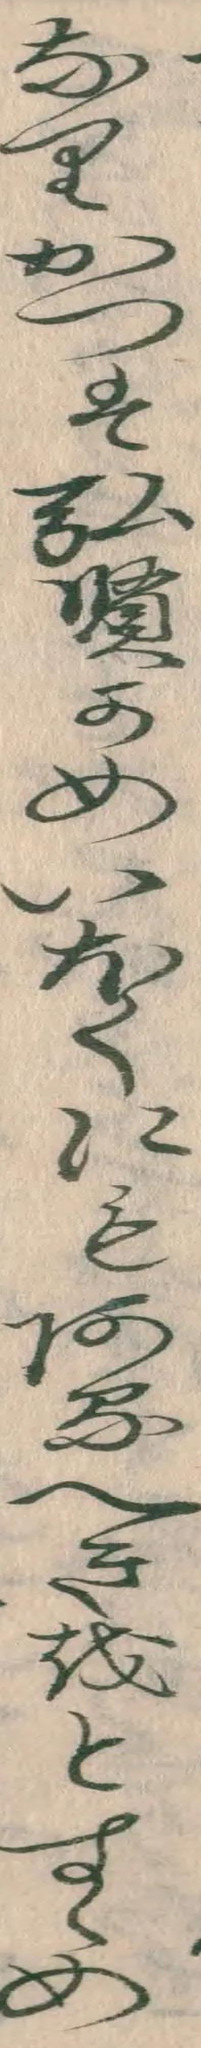なりかつは弘賢かめいほくにもあるへきをとすゝめ
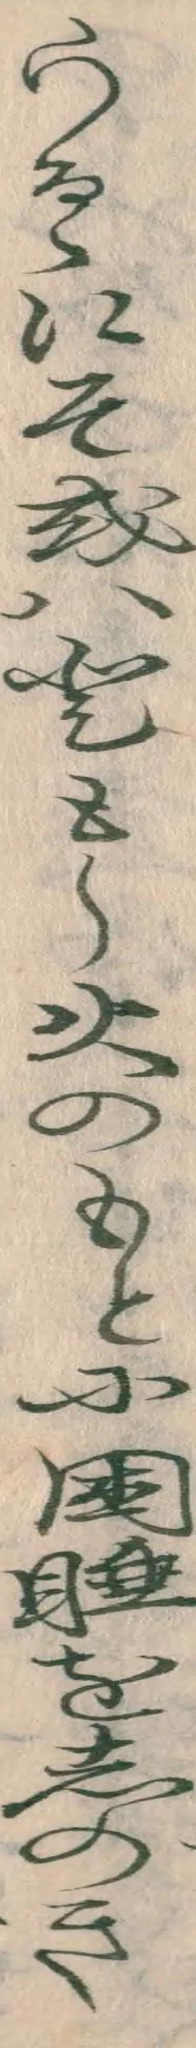らるゝにそ或はともし火のもとに困睡をしのき
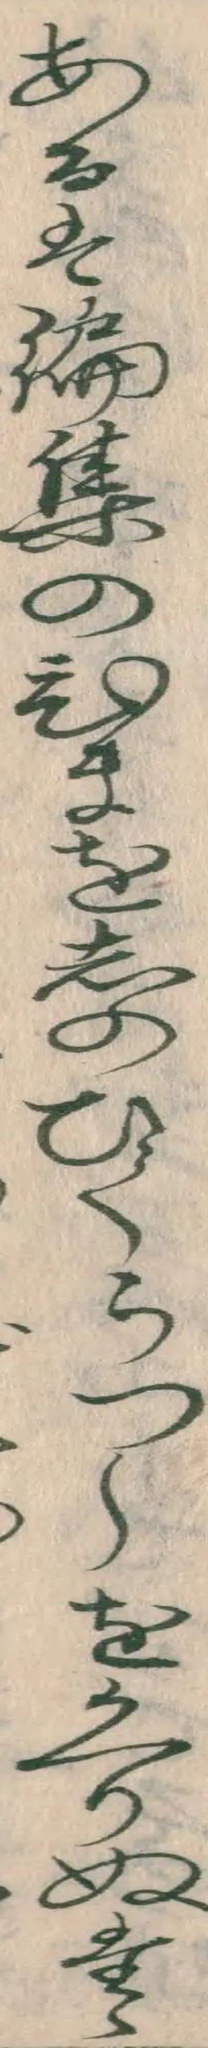あるは編集のひまをしのひくらつしをかえりぬたゝ
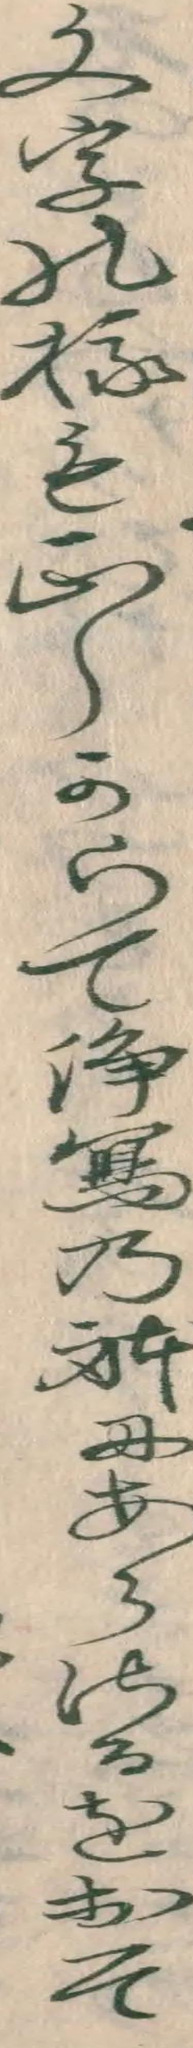文字の様も正しからて浄写の体にあらさるをおそ
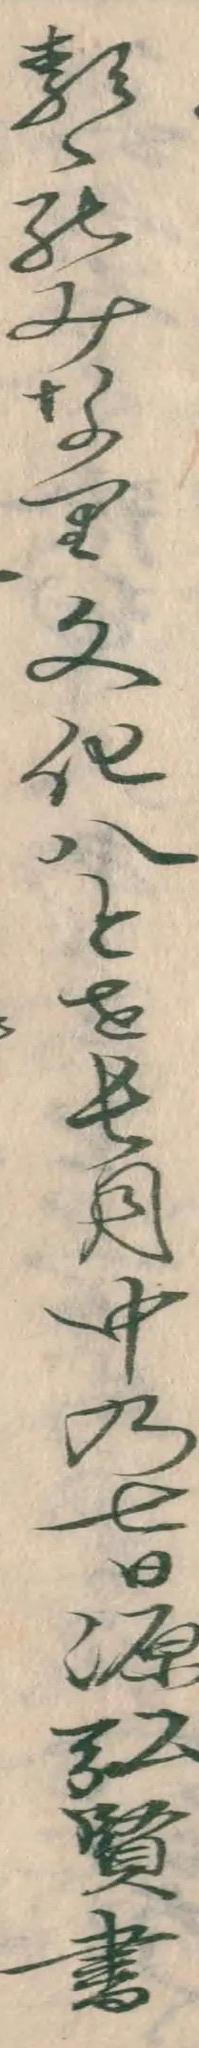るゝのみなり文化八とせ長月中の七日源弘賢書
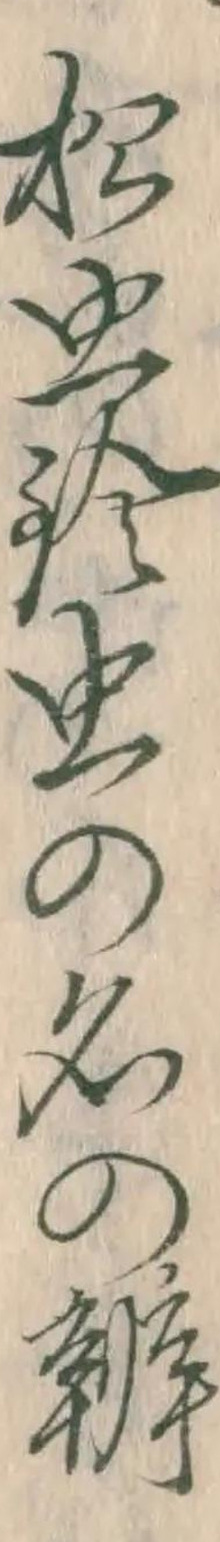松虫鈴虫の名の辨
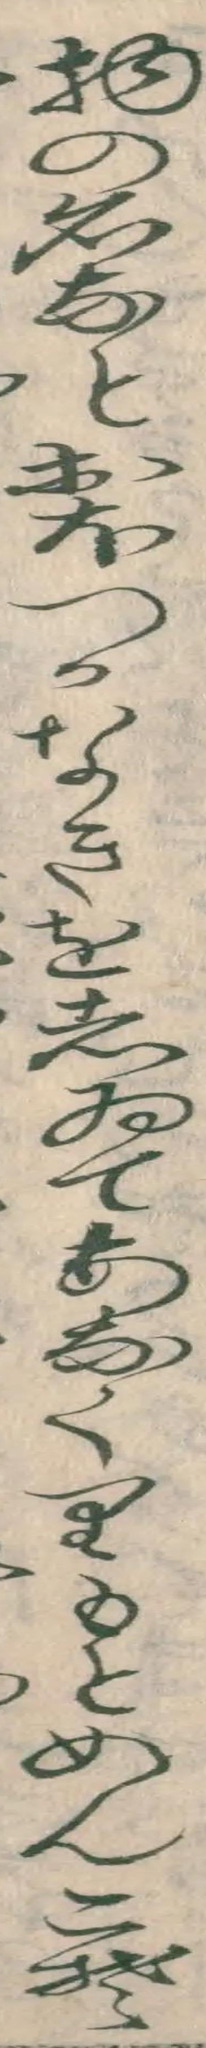物の名なとおほつかなきをしゐてあなくりもとめんこそ
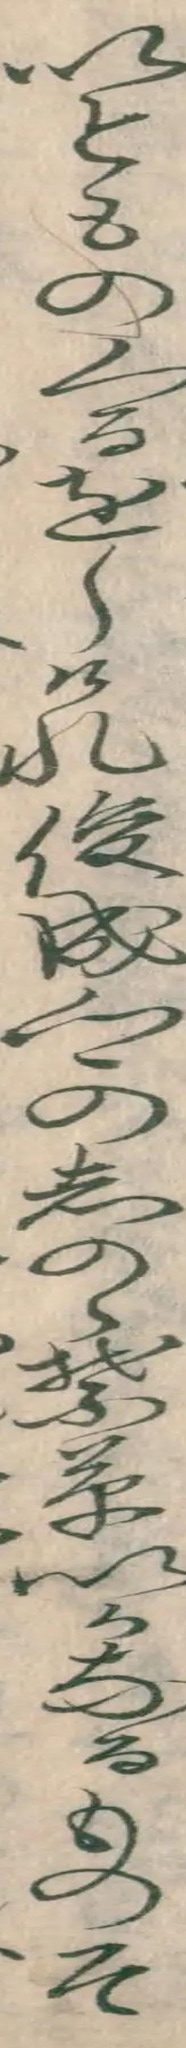いとものくるをしけれ俊成卿のしのゝ葉草いかなるものそ
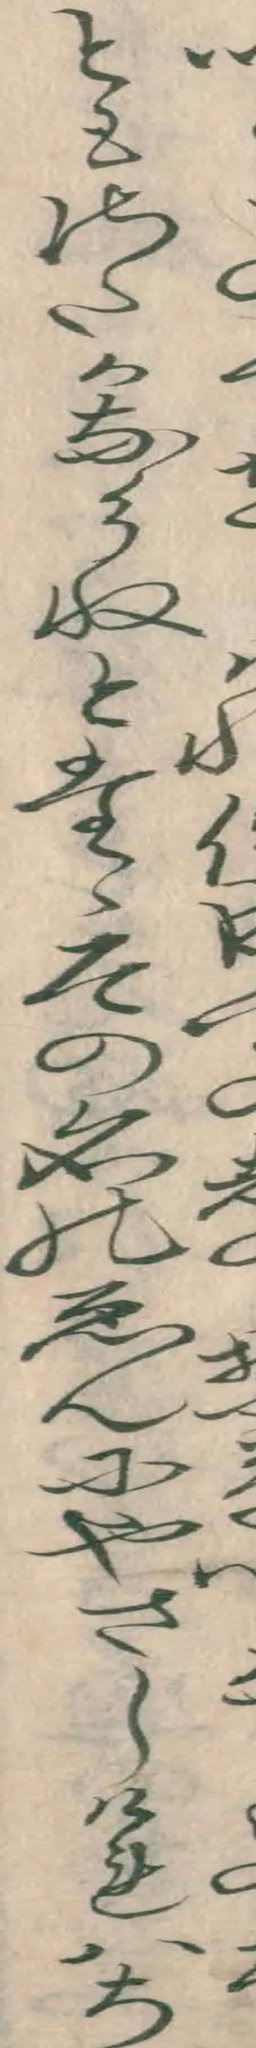ともさたかならねとたゝその名のゑんにやさしけれはち

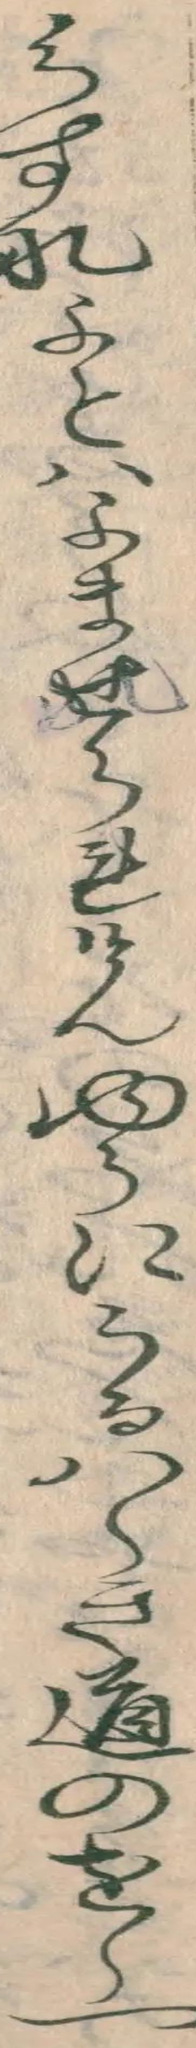らすなよとはよませられけんゆうにうるはしき道のをしへ
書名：千蟲譜 3巻. [3]
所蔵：国立国会図書館 National Diet Library, JAPAN
